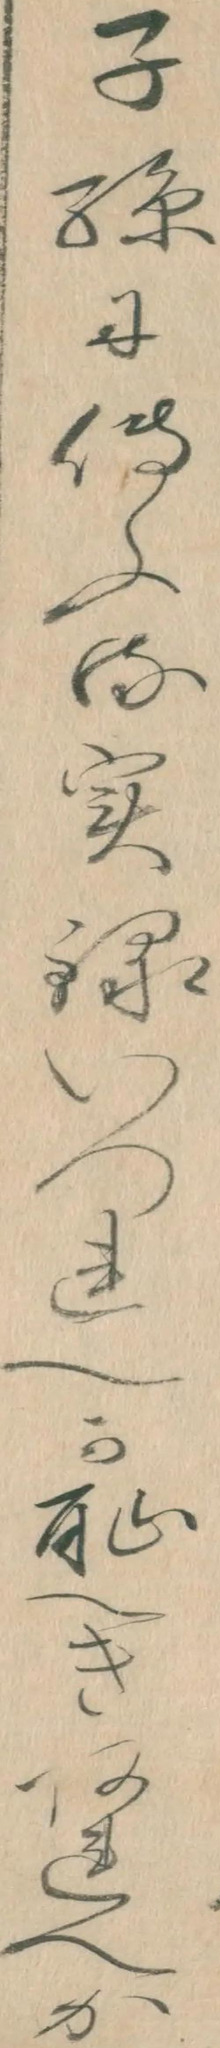子孫に伝ふる実録いつれへか恥へき何れへか

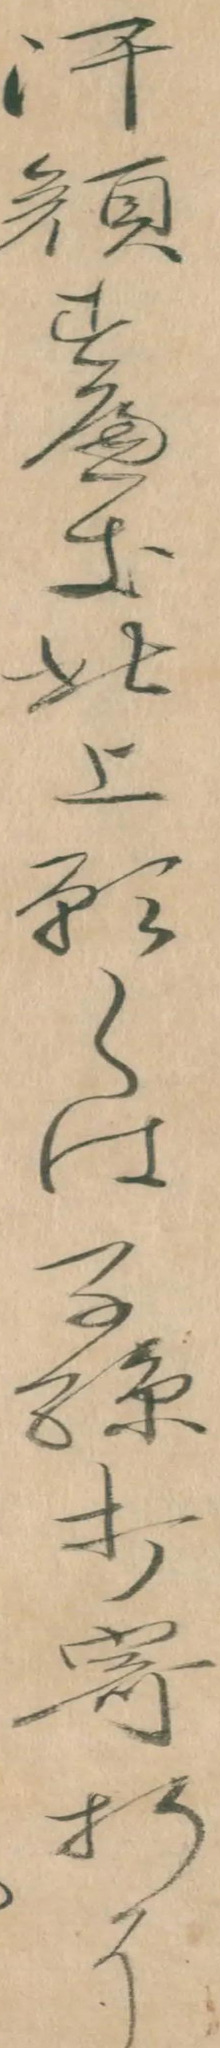汗顔すへき此上願くは子孫打寄折に
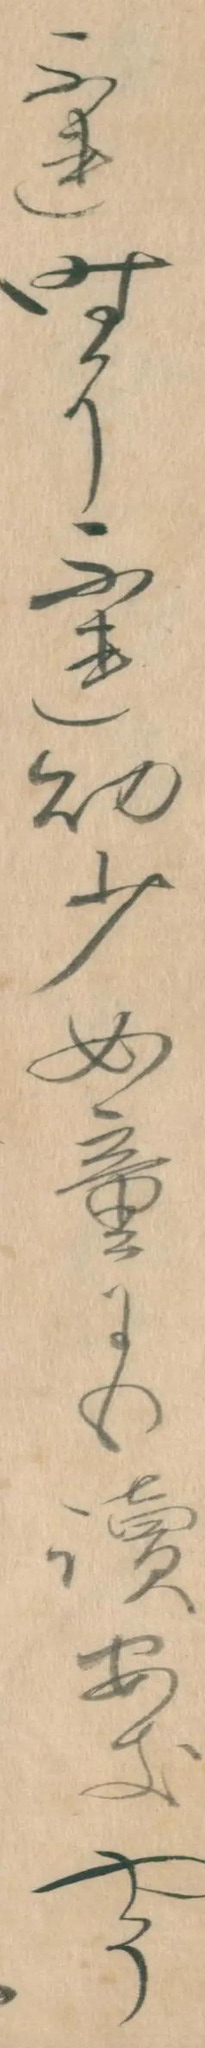ふれ時にふれ幼少女童にも読安きやう
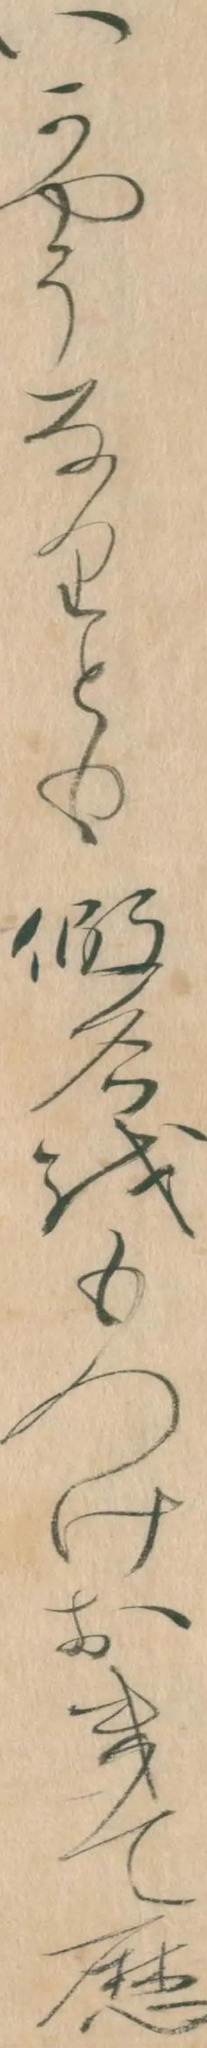いかやうなりとも仮名をもつけおきて慰
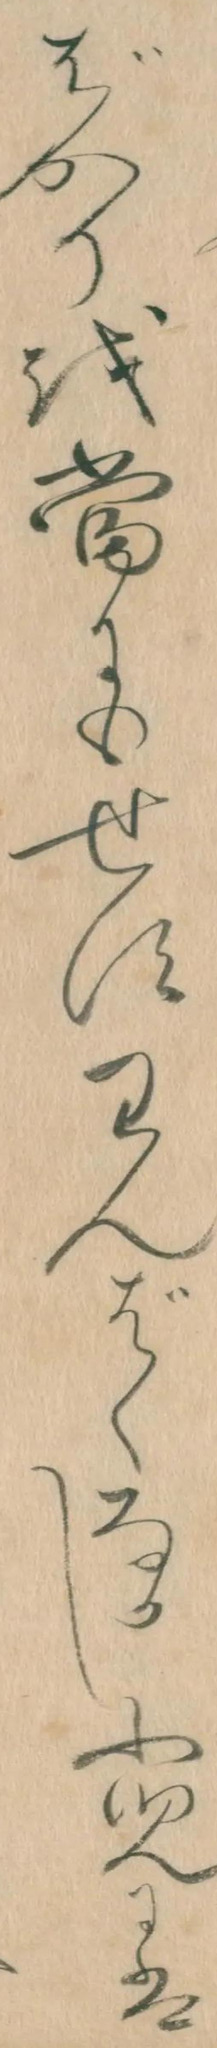ばかりを当にもせすわんばくなりし小児には
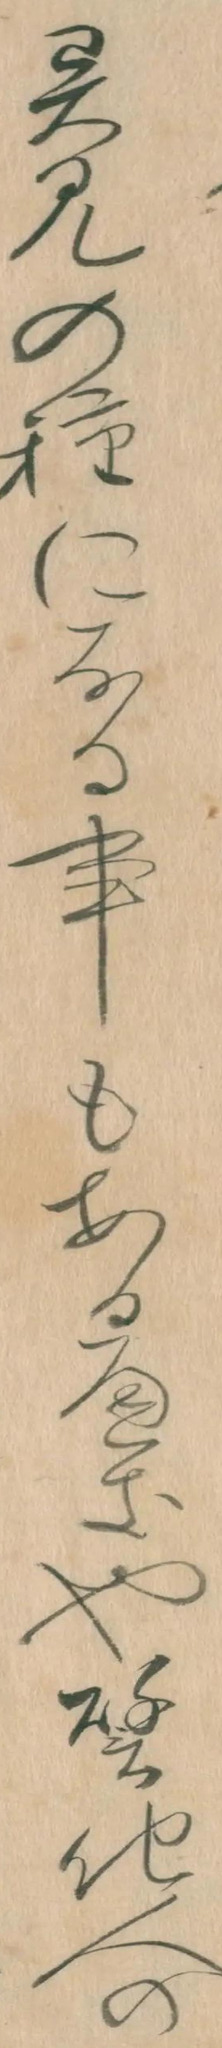異見の種になる事もあるへきや譬他人の
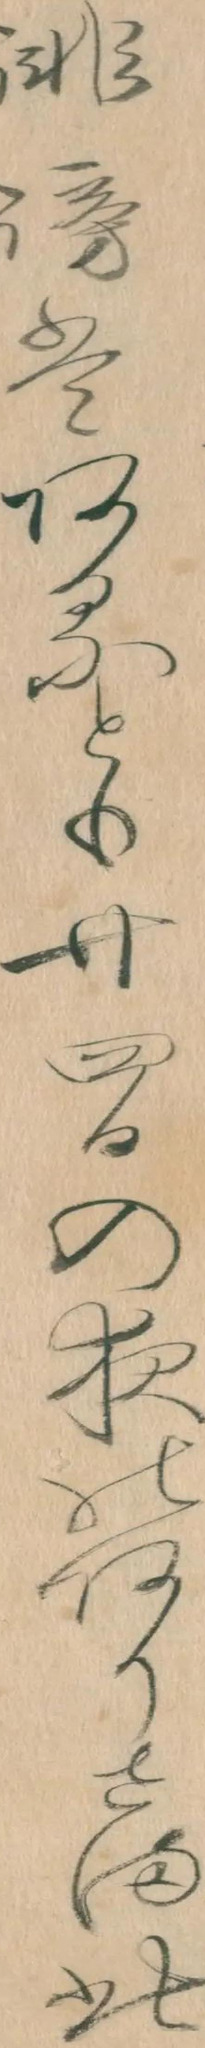誹謗はあるとも廿四日の夜のありさま此
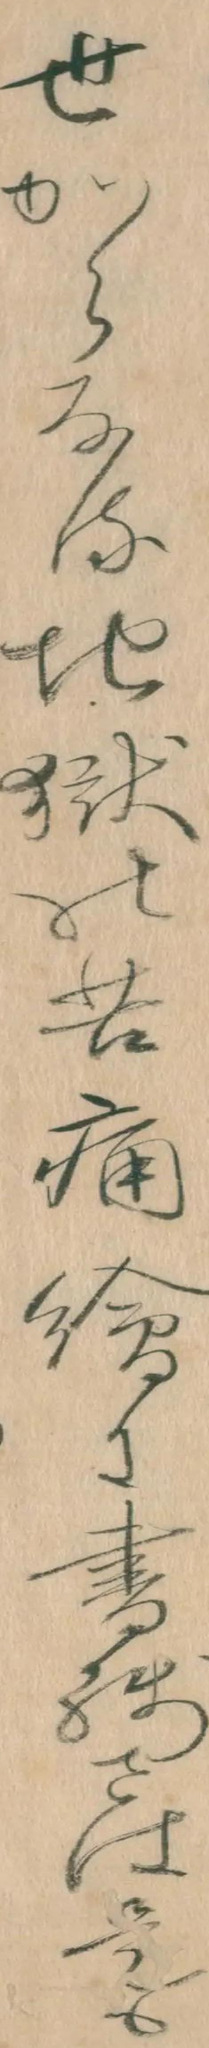世からなる地獄の苦痛絵に書残さは是も
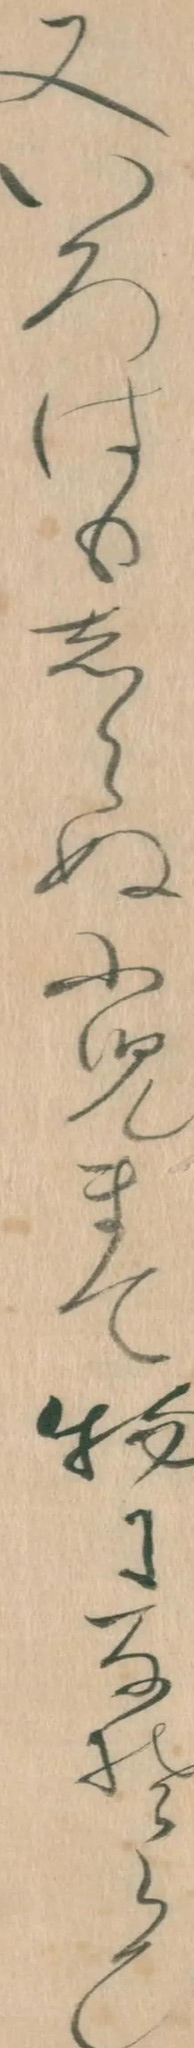又いろはもしらぬ小児まて物になそらひ
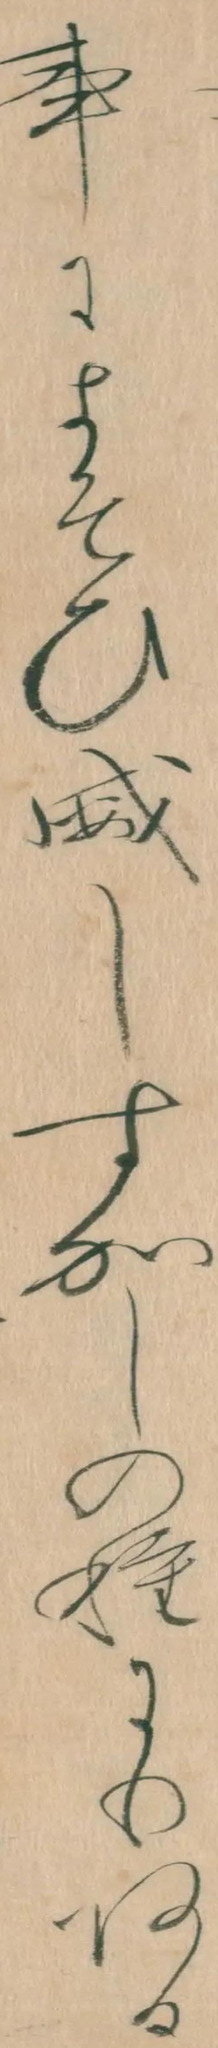事によそひ威しすかしの種にもある
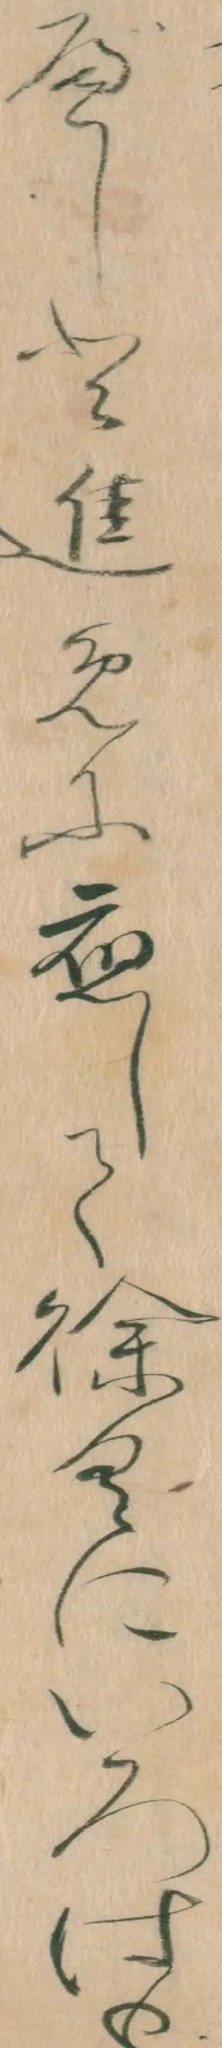べしと進めに応して徐くにいろはも
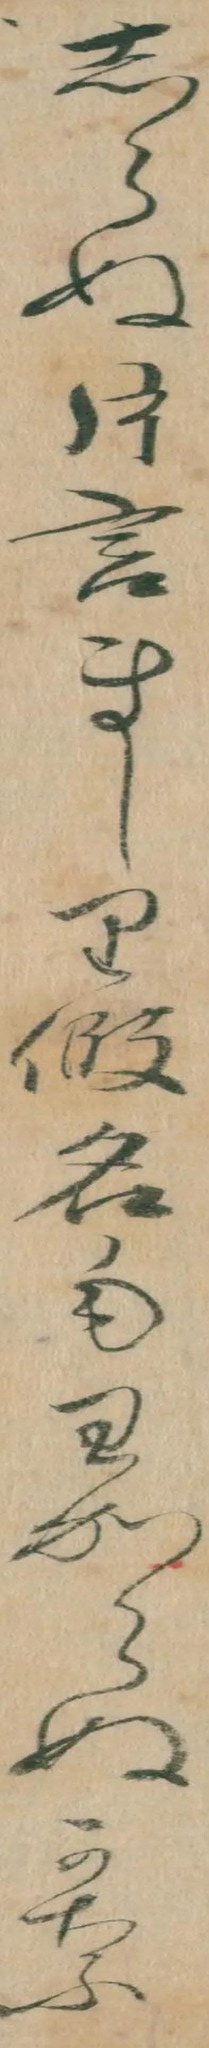しらぬ片言ましり仮名もわからぬかな
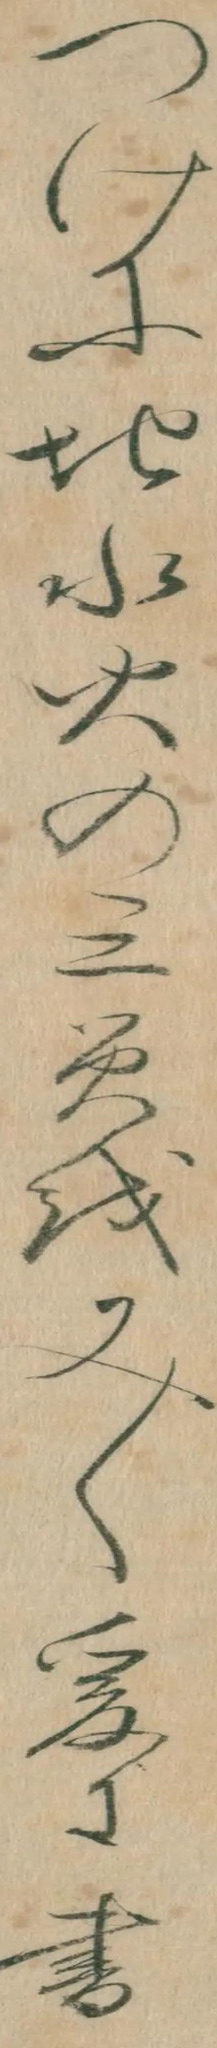づけに地水火の三災を又〳〵爰に書
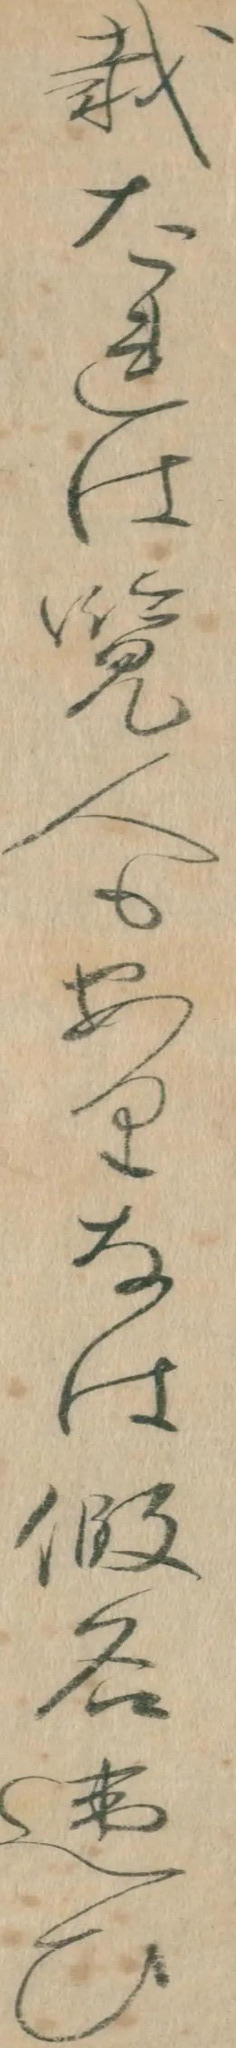載たれは覧人もありなは仮名違ひ
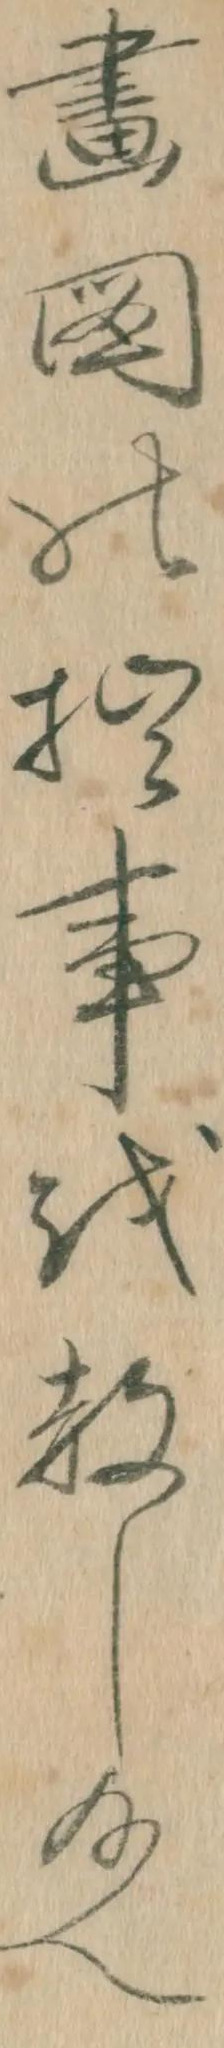画図の拙事を赦し給へ
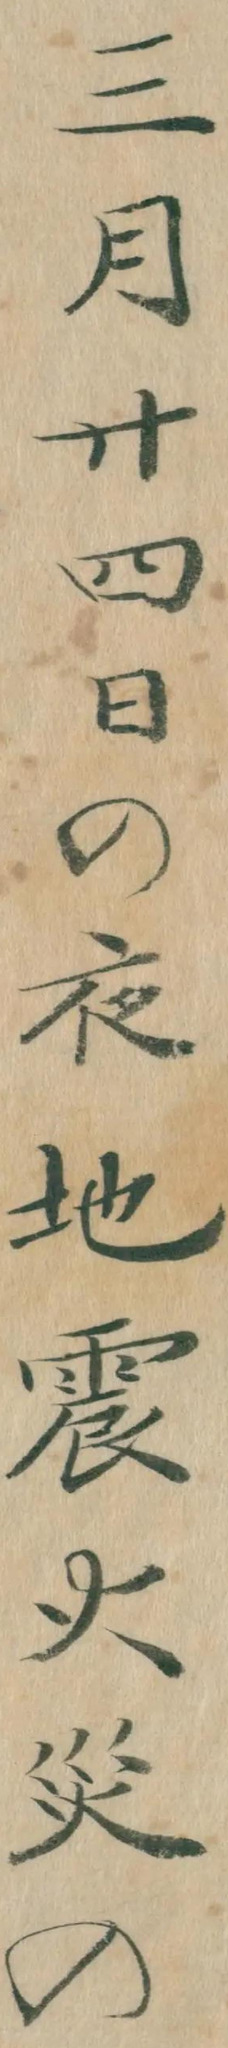三月廿四日の夜地震火災の
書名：俗語之種. [4]
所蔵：国立国会図書館 National Diet Library, JAPAN
